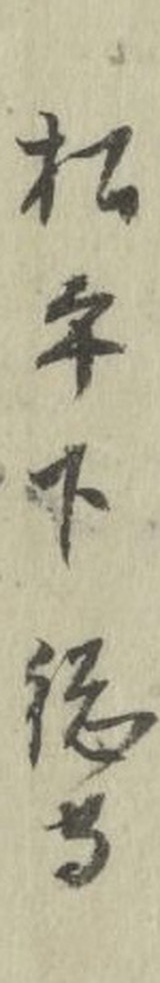同断松平下総守
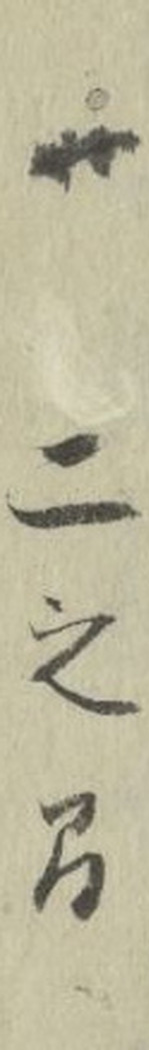一二之間
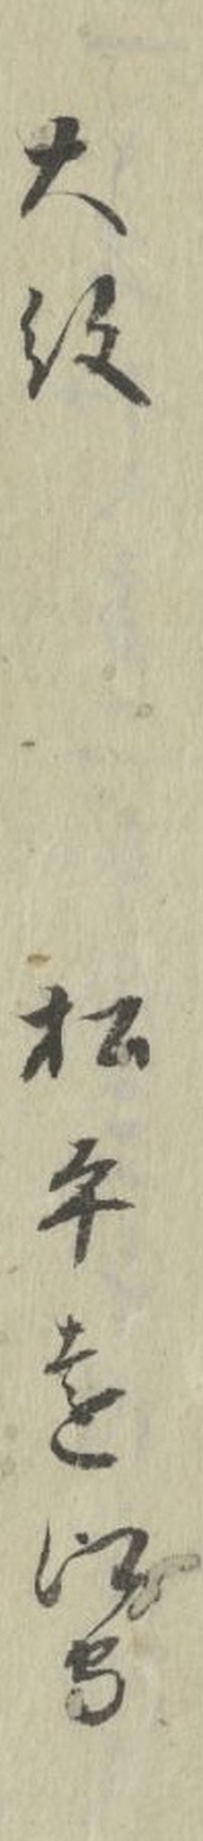大紋松平遠江守
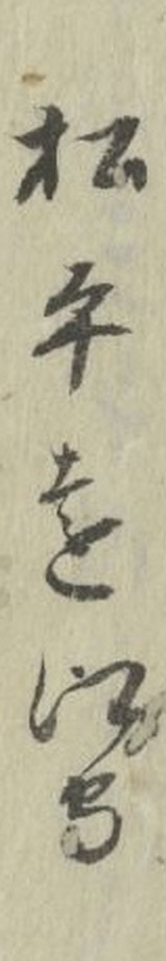同断松平美濃守
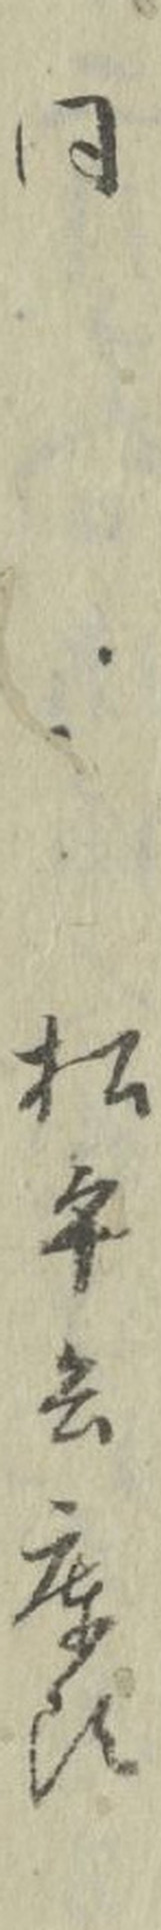同松平兵庫頭
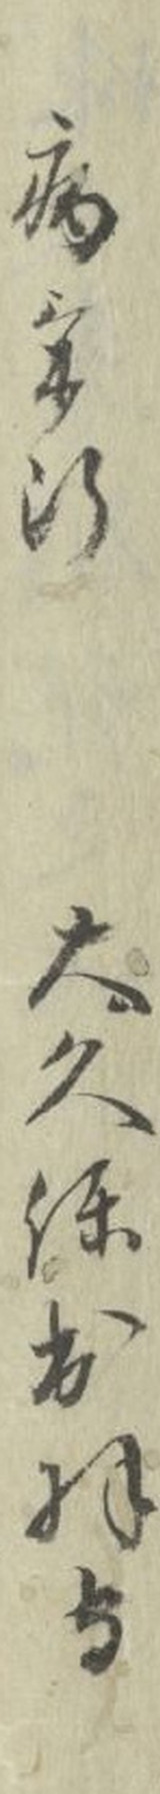病気断大久保出羽守
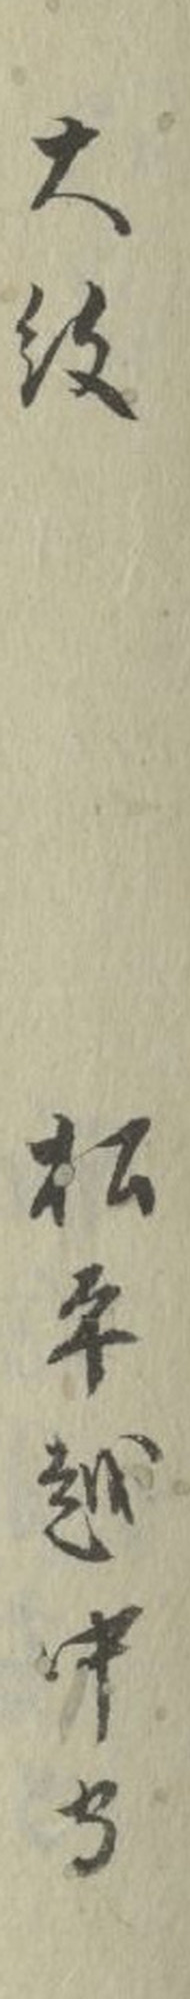大紋松平越中守
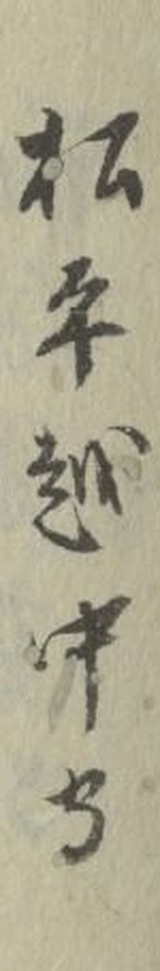同断松平美濃守
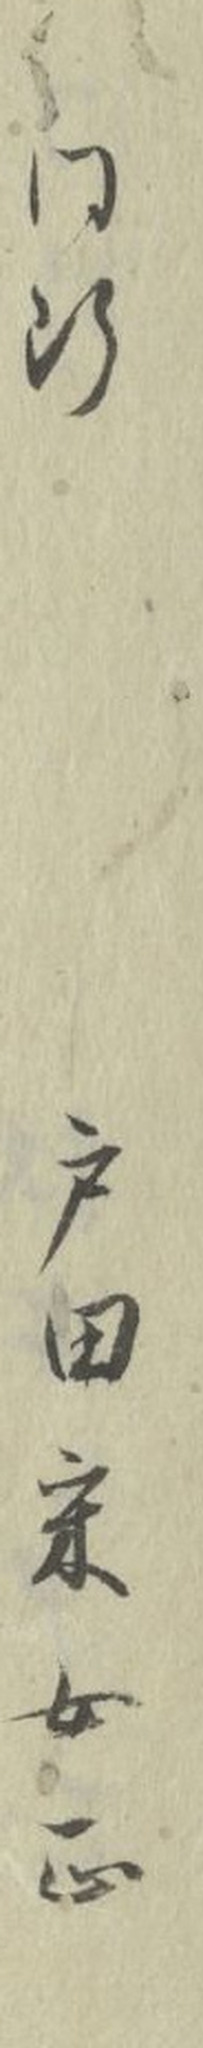同断戸田采女正
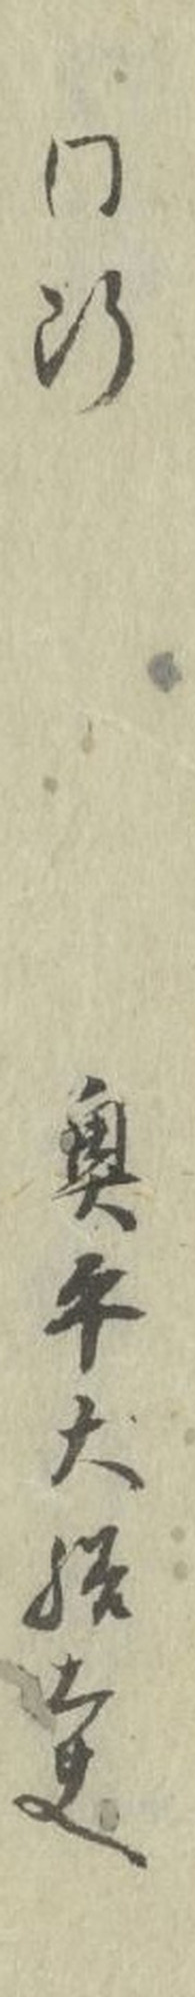同断奥平大膳大夫
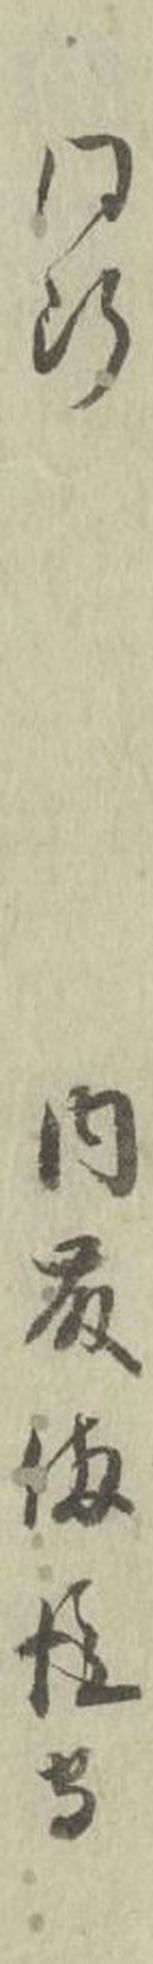同断内藤佐渡守
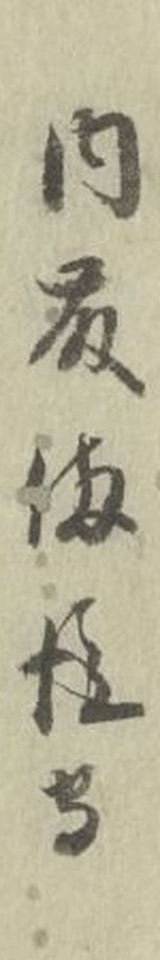同断内藤佐渡守
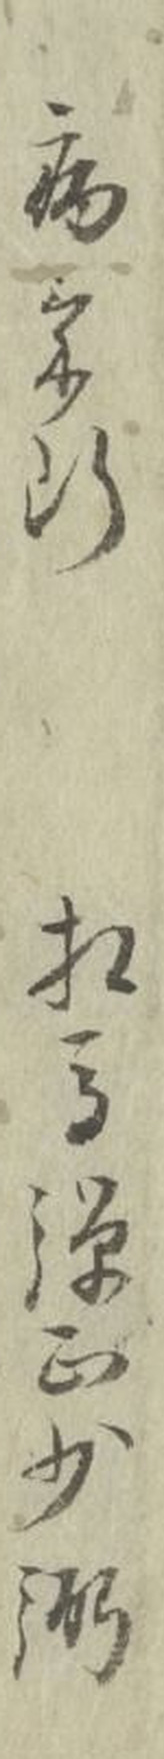病気断相馬弾正少弼
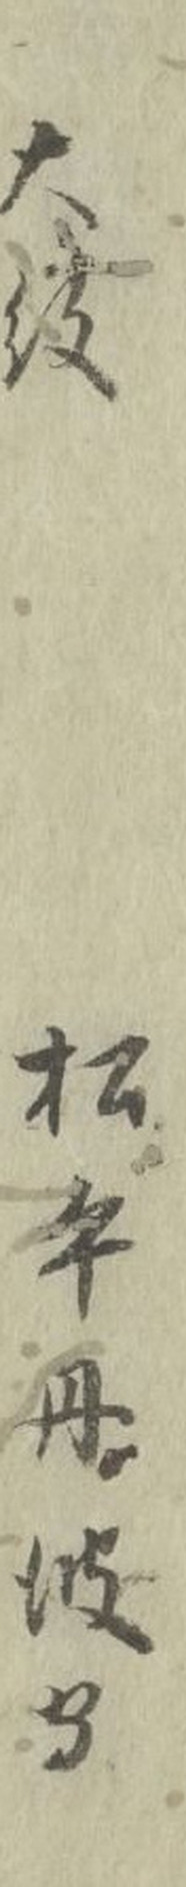大紋松平丹波守
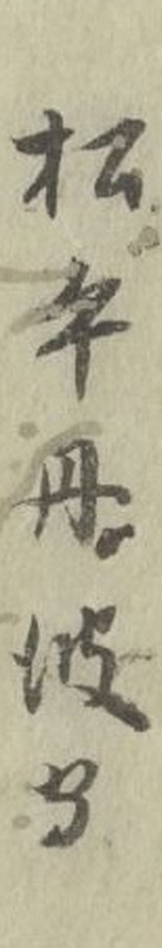同断松平美濃守

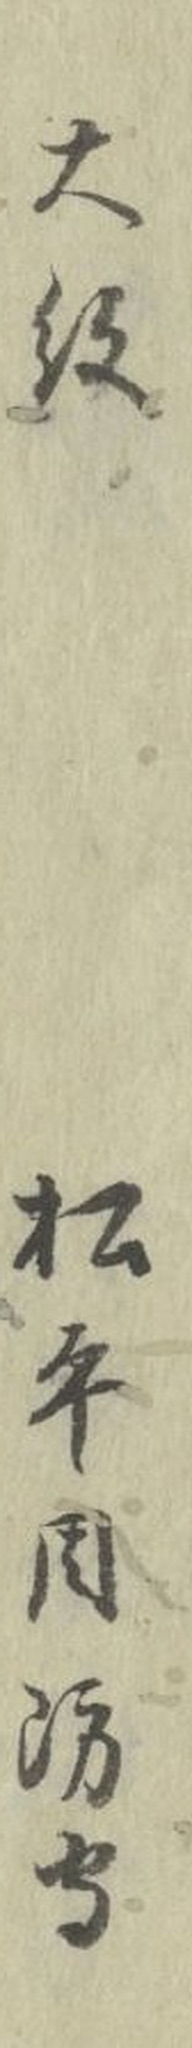大紋松平周防守
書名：琉球来朝記 自一至七
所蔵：University of the Ryukyus Library
